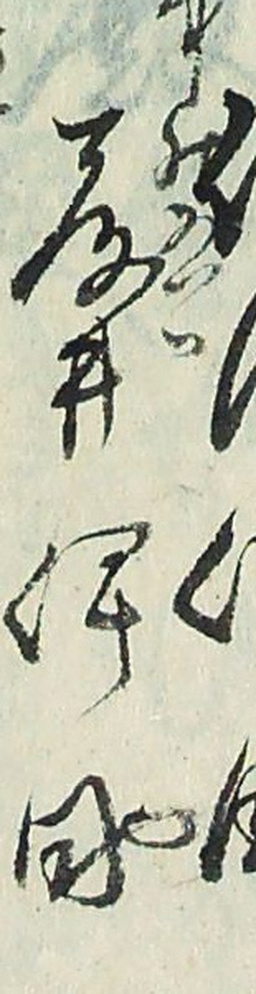藤井伊助
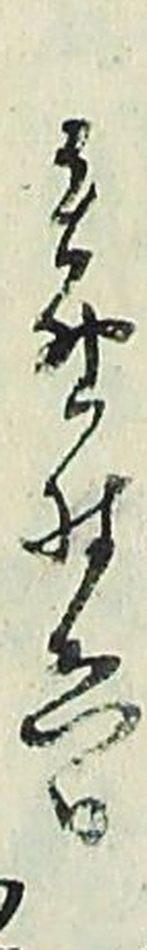矢野村右同
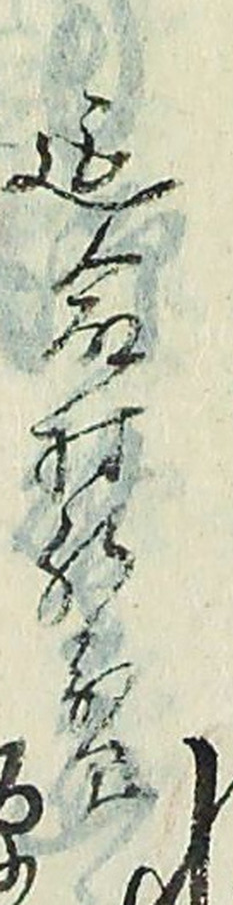延命村肝煎
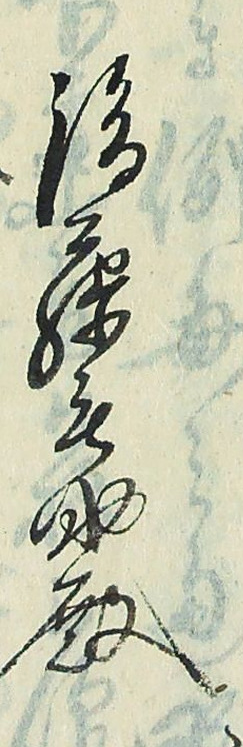後藤庄助殿
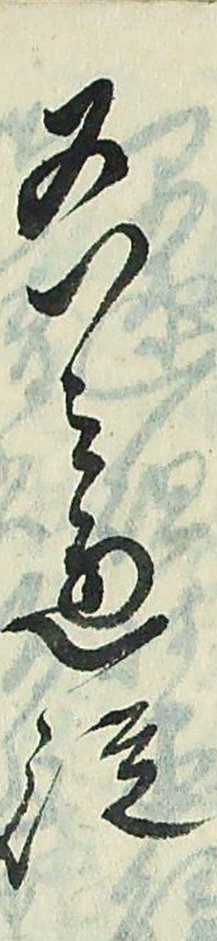右之通従
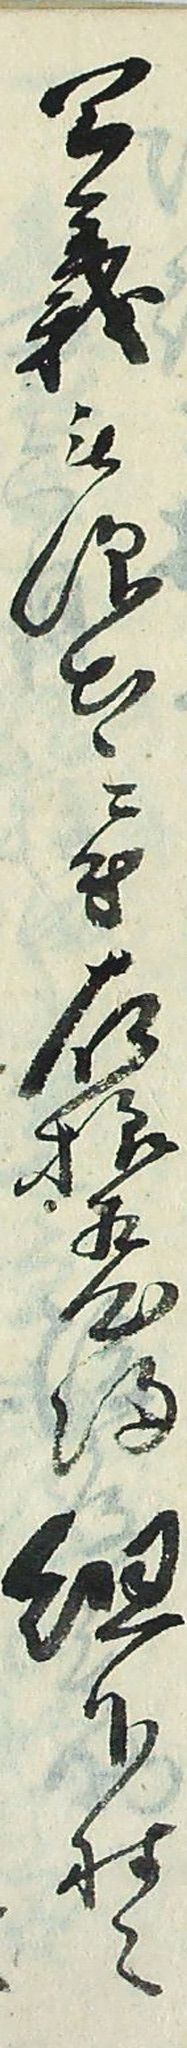公義被仰出候に付右様相心得組下村々
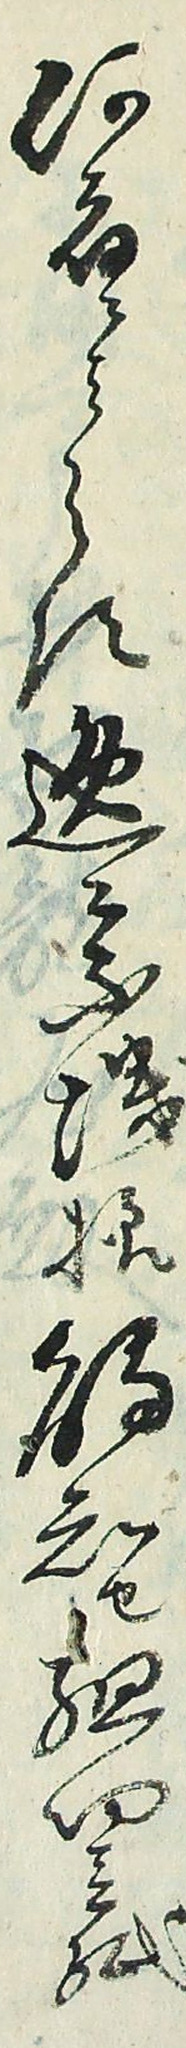何者によらす逸々不洩様触知せ組切壱紙

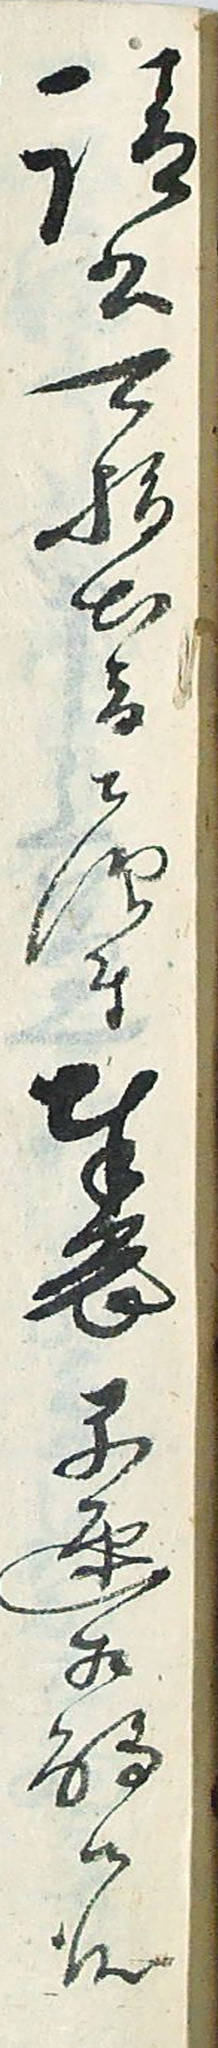請書可指出旨被仰付奉畏早速相触候所
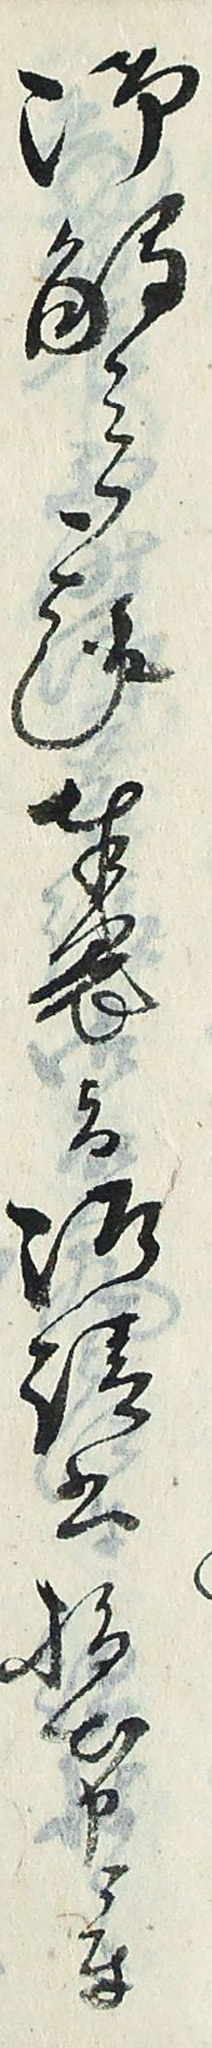御触之御趣奉畏旨御請書指出申に付
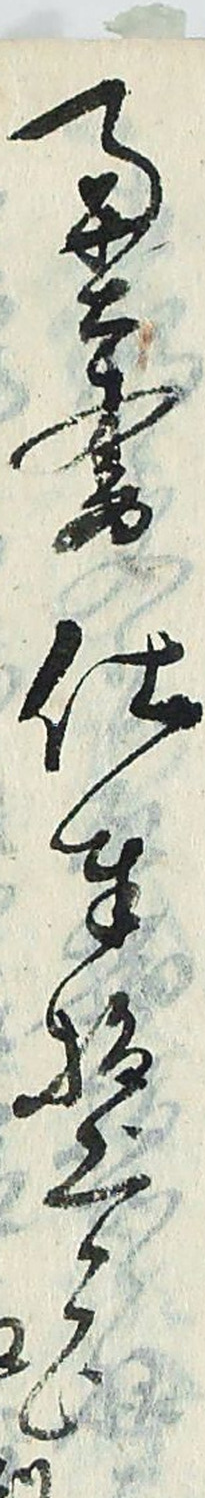奥書仕奉指上候以上
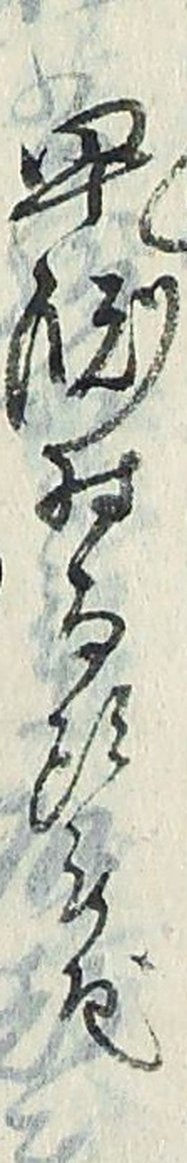早淵村与頭庄屋
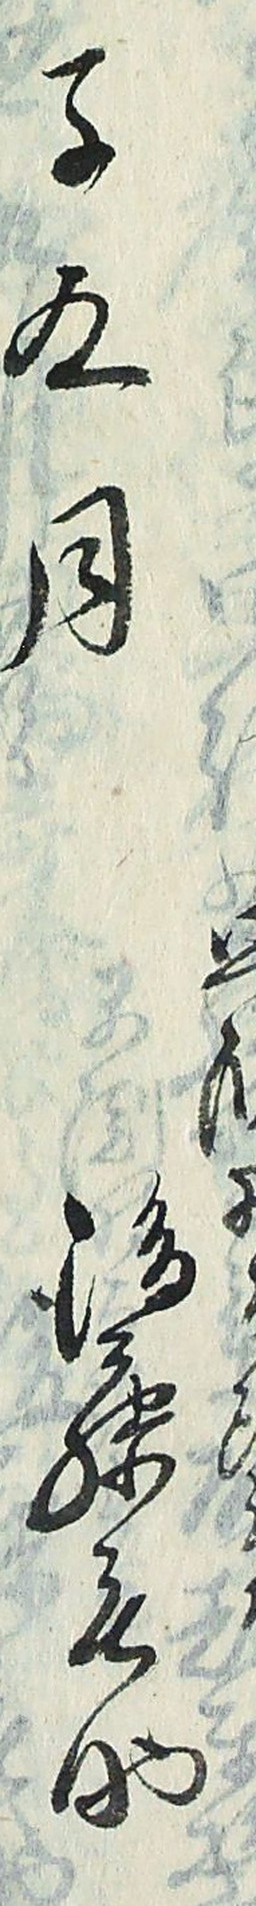子九月後藤庄助
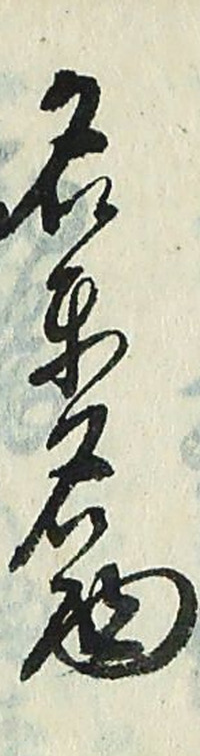名東名西
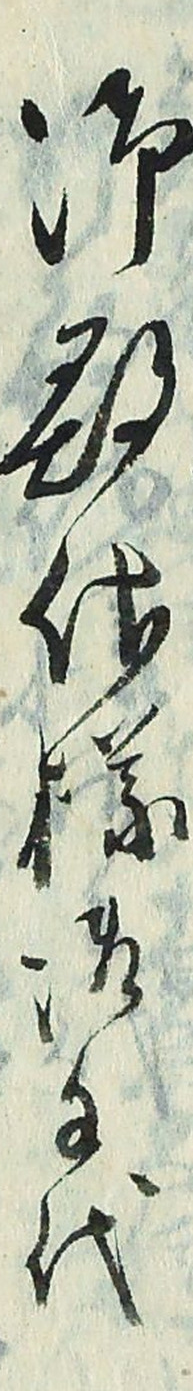御郡代様御手代
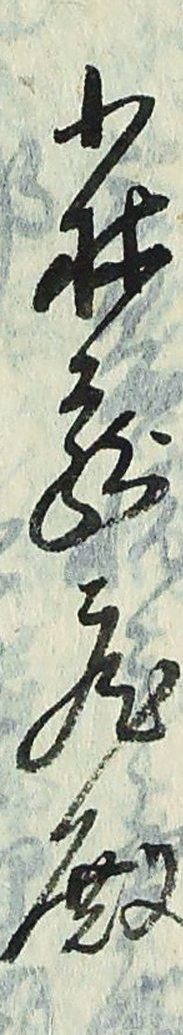小林龍蔵殿
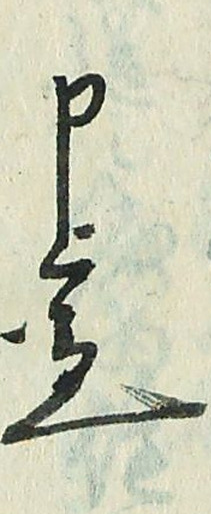申上覚
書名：諸御用御□受書控
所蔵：鳴門教育大学 Naruto University of Education
